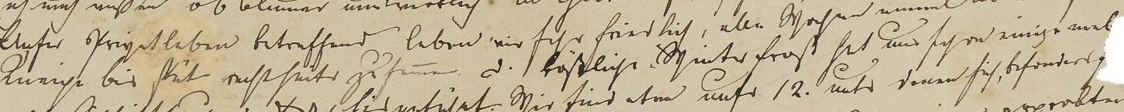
Kneipe bis spät recht heiter zusammen. d. köstliche Winterfrost hat uns schon einige male
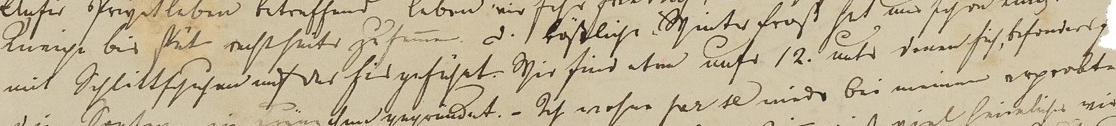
mit Schlittschuhen auf das Eis geführt. Wir sind etwa unser 12. unter denen sich, besonders
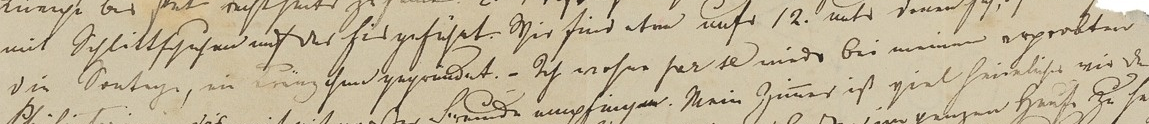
die Sontage, ein Kränzchen gegründet. – Ich wohne per se wieder bei meinem erprobten
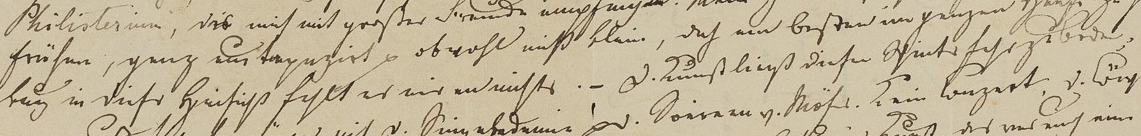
kurz in dieser Hinsicht fehlt es mir an nichts. – d. Kunst liegt diesen Winter sehr zu Boden;
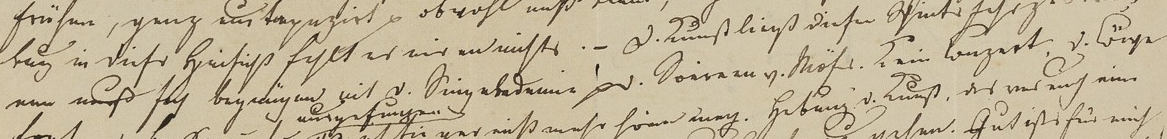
man muß sich begnügen mit d. Singakademie &d. Soireen v. Möser. Kein Konzert, d. Cörpe
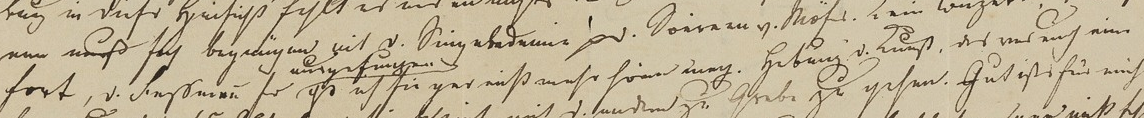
fort, d. Fassmann so ausgesungen dß ich sie gar nicht mehr hören mag. Hebung d. Kunst, das war auch eine
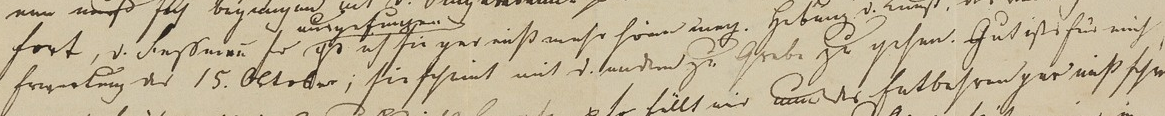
Erwartung des 15. Oktober; sie scheint mit d. andern zu Grabe zu gehen. Gut ists für mich,
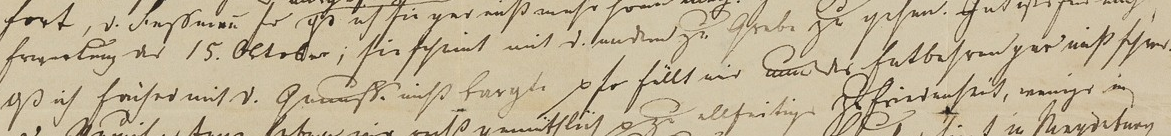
dß ich früher mit d. Genusse nicht kargte & so fällt mir auch das Entbehren gar nicht schwer.
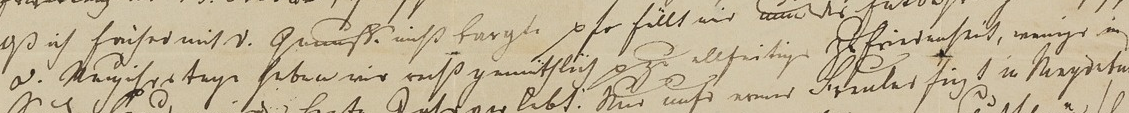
d. Neujahrstage haben wir recht gemüthlich & zu allseitiger Zufriedenheit, weniger in
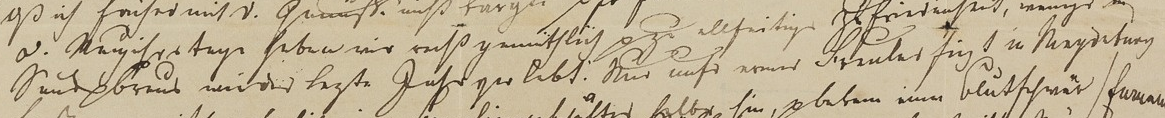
Saus & Braus wie das lezte Jahr verlebt. Nur unser armer Freuler sizt in Magdeburg
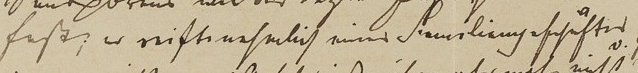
fest; er reiste nehmlich eines Familiengeschäftes
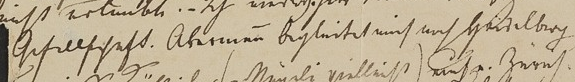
Gesellschaft. Akermann begleitet mich nach Heidelberg,
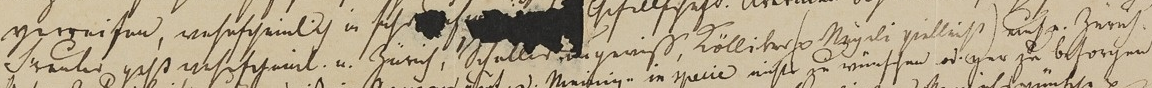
Freuler geht wahrscheinl. n. Zürich, Schaller ungewiss, Kölliker (& Nägeli vielleicht) auch n. Zürich.
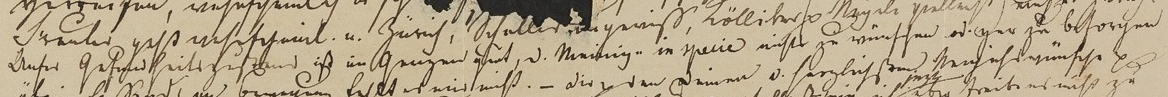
Unser Gesundheitszustand ist im Ganzen gut, d. Meinige in specie nichts zu wünschen od. gar zu besorgen
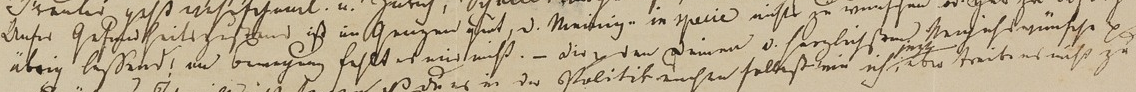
übrig lassend! an Bewegung fehlt es mir nicht. – Dir & den Deinen d. herzlichsten Neujahrwünsche &
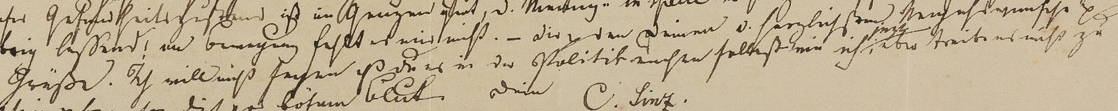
Grüße. Ich will nicht sagen dß du es in der Politik machen sollest wie ich jezt; aber treibe es nicht zu
